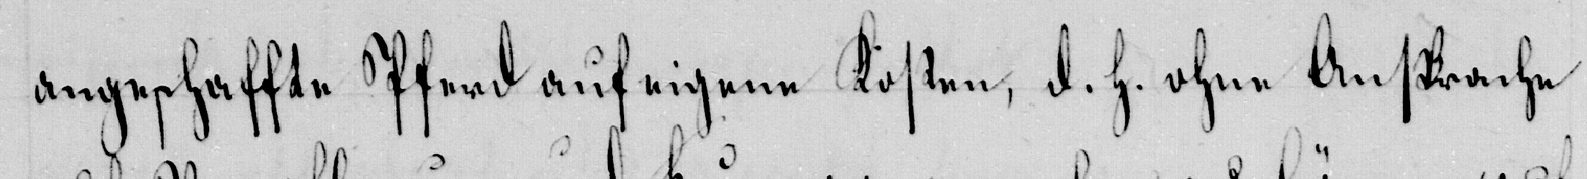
angeschaffte Pferd auf eigene Kosten, d. h. ohne Ansprache
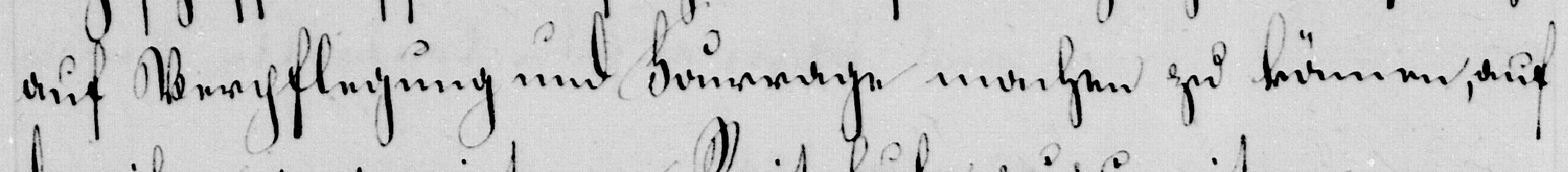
auf Verpflegung und Fourrage machen zu können, auf
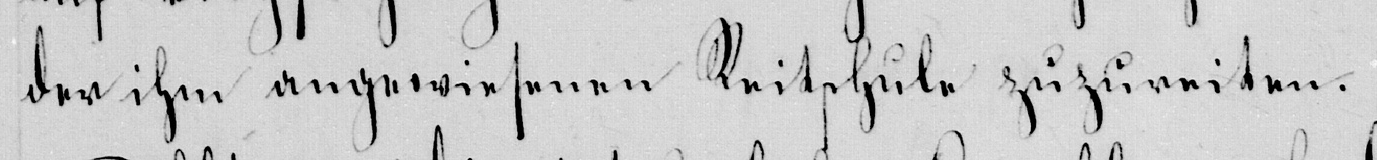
der ihm angewiesenen Reitschule zuzureiten.
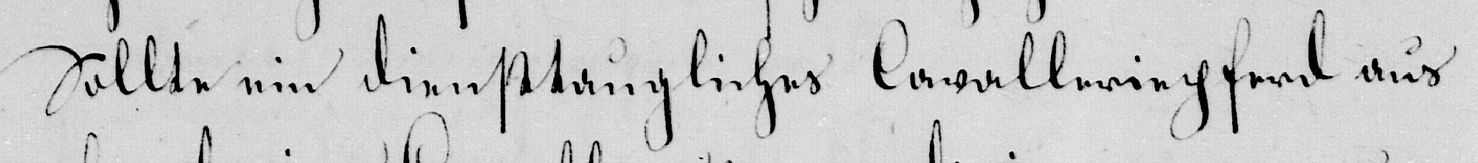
Sollte ein diensttaugliches Cavalleriepferd aus
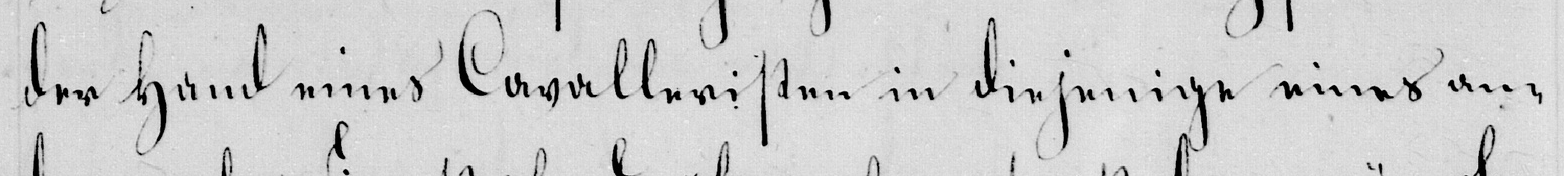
der Hand eines Cavalleristen in diejenige eines an¬
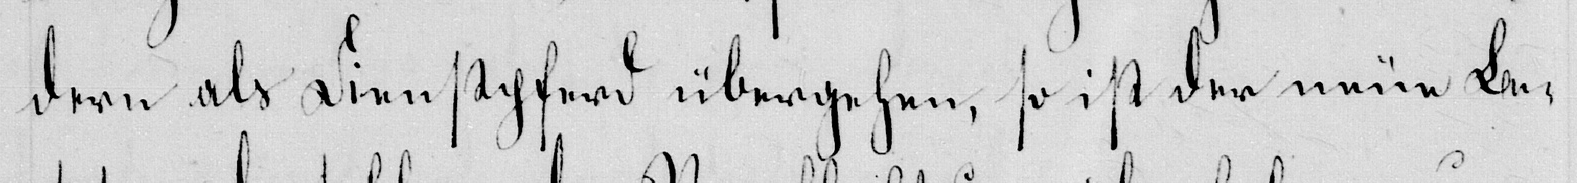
dern als Dienstpferd übergehen, so ist der neue Be¬
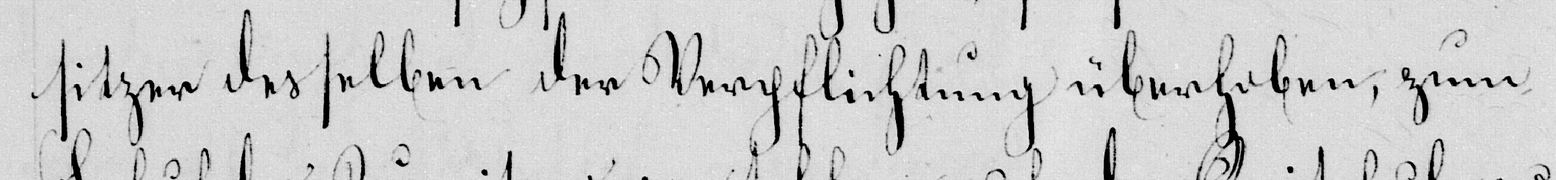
sitzer desselben der Verpflichtung überhoben, zum
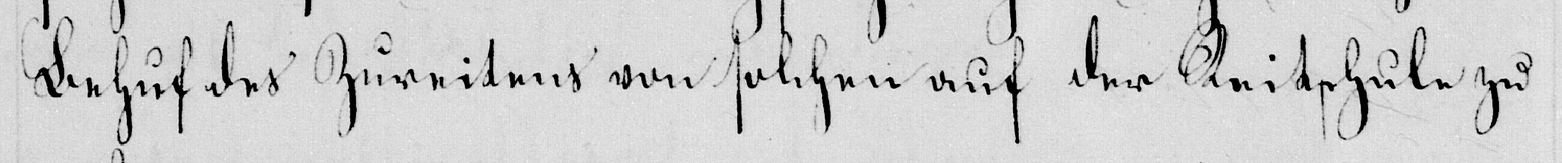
Behuf des Zureitens von solchen auf der Reitschule zu
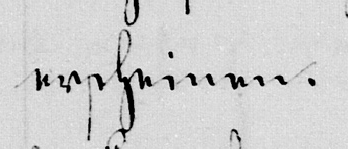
erscheinen.
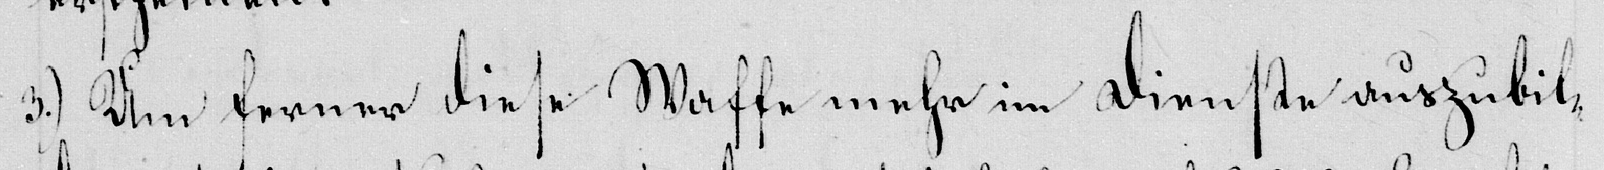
3.) Um ferner diese Waffe mehr im Dienste auszubil¬
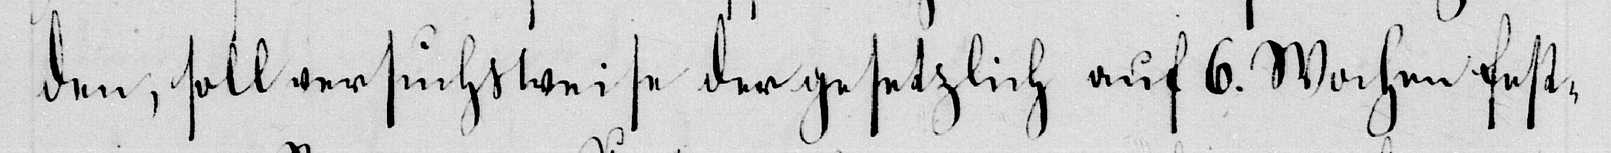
den, soll versuchsweise der gesetzlich auf 6. Wochen fest¬
